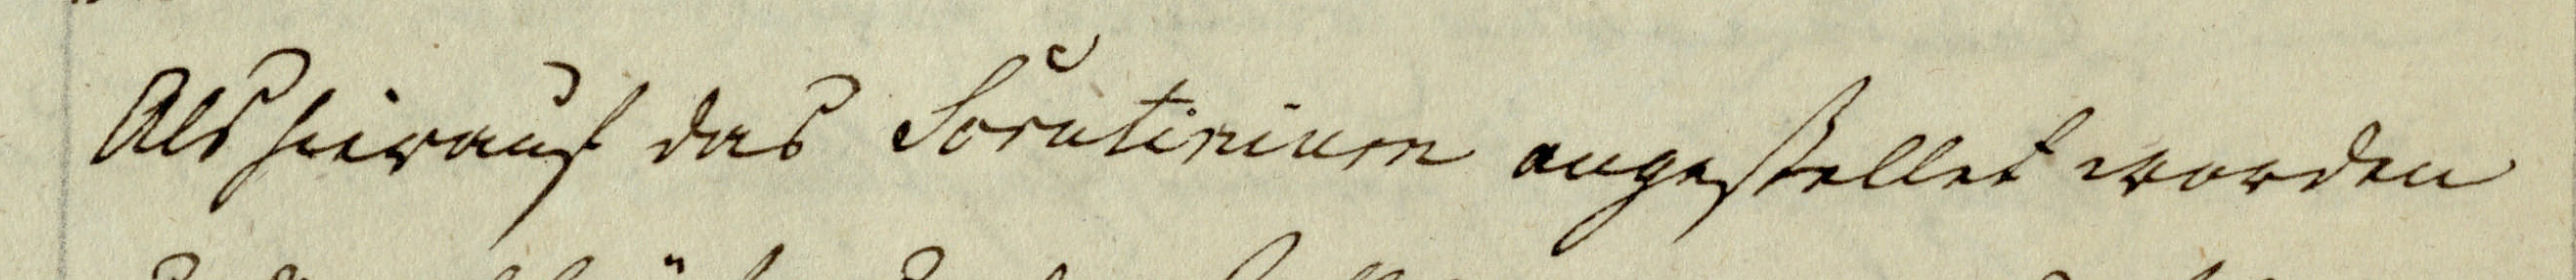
Als hierauf das Scrutinium angestellet worden
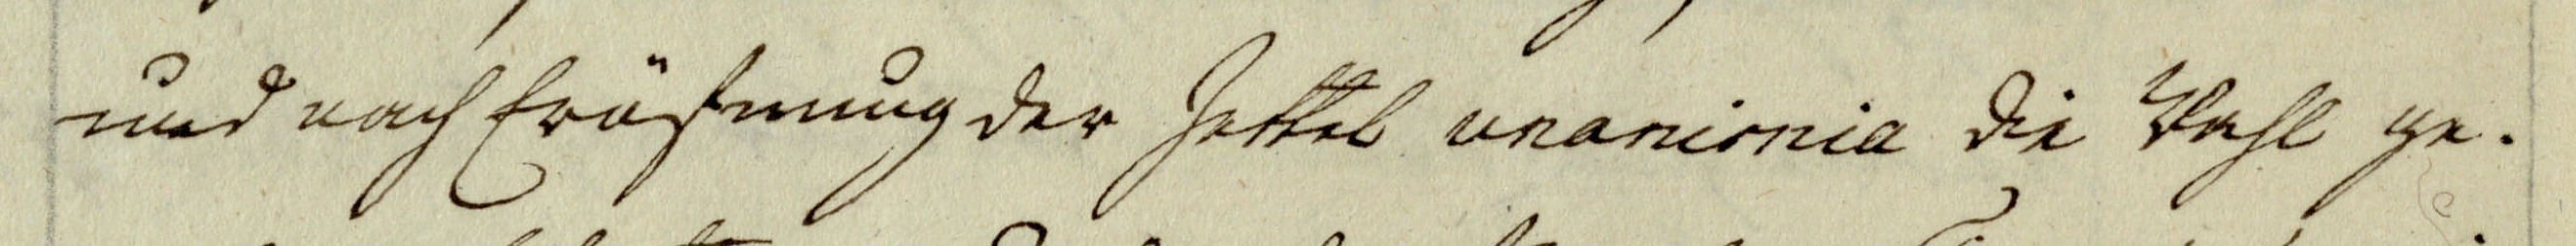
und nach Eröfnung der Zettel unanimia die Wahl ge¬
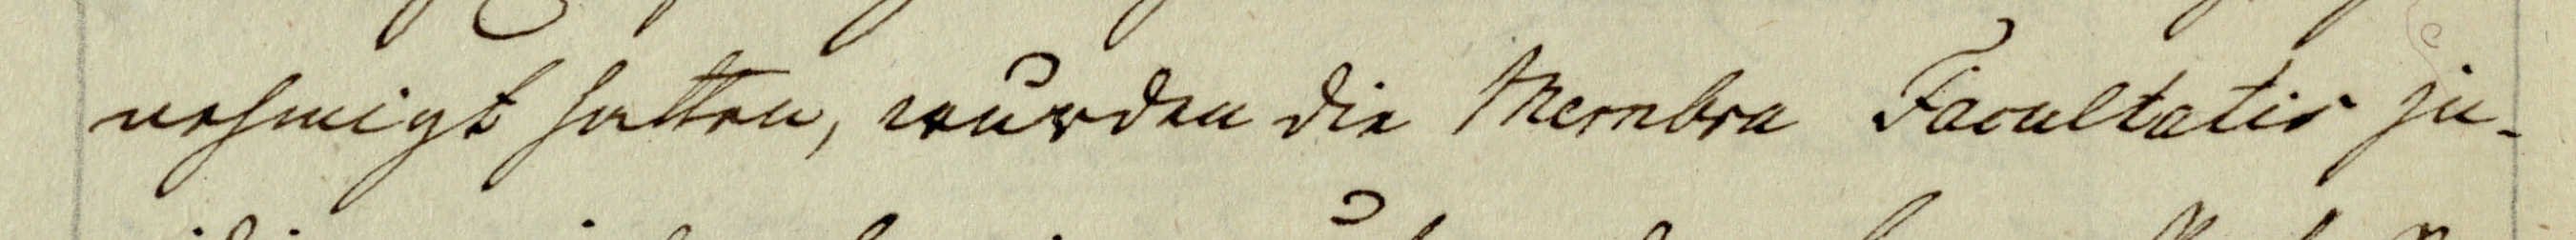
nehmigt hatten, wurden die Membra Facultatis ju¬
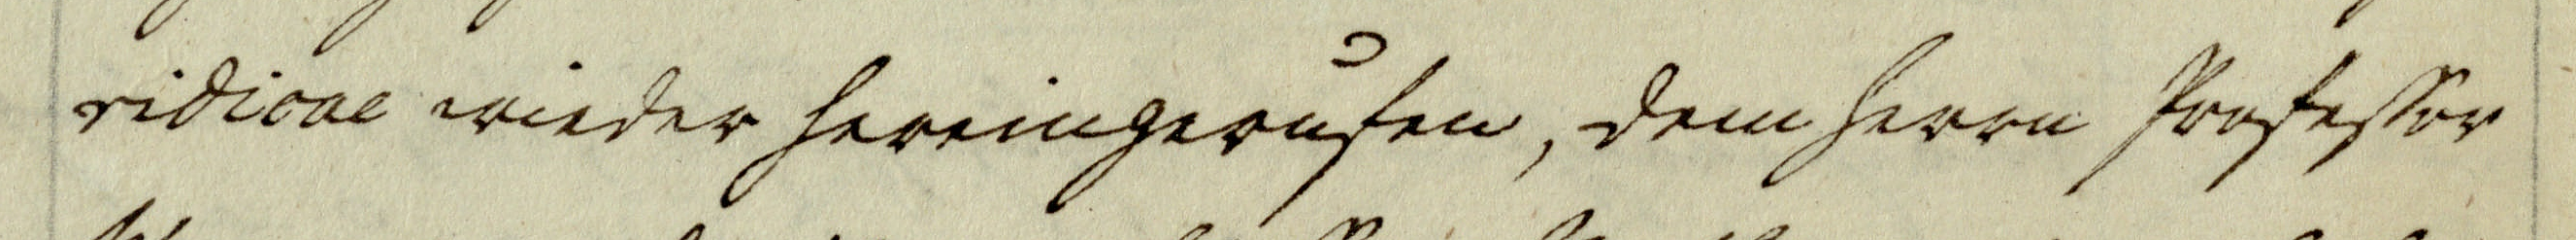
ridicae wieder hereingerufen, dem Herrn Professor
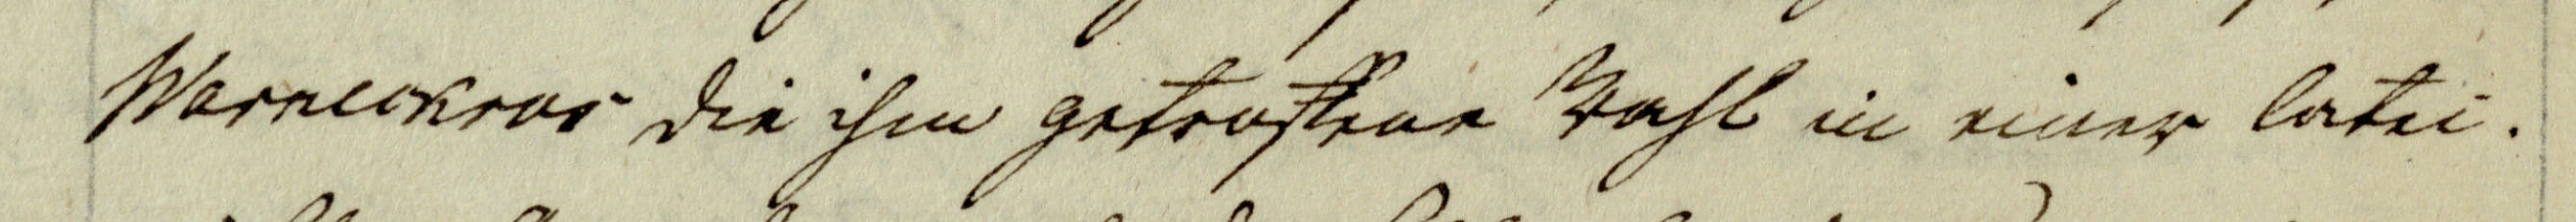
Warneckros die ihm getroffene Wahl in einer latei¬
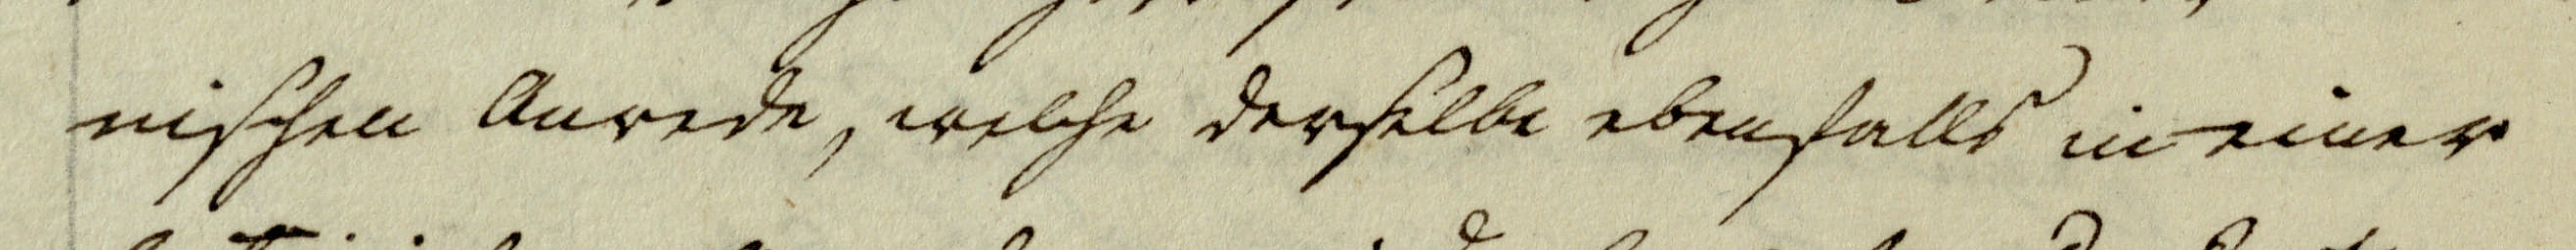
nischen Anrede, welche derselbe ebenfalls in einer
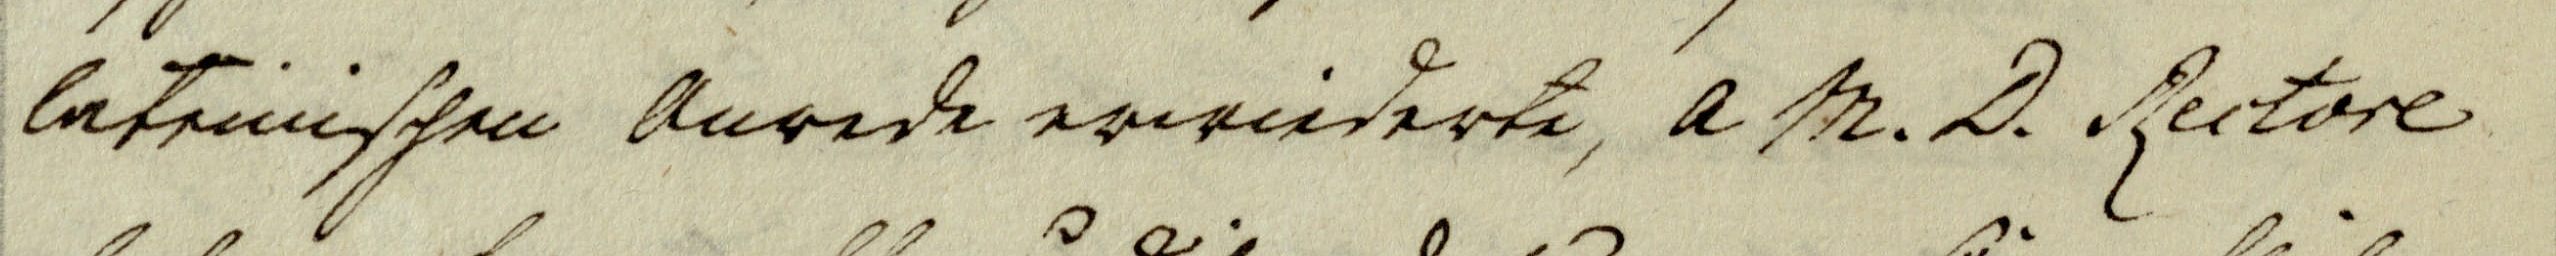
lateinischen Anrede erwiederte, a M. D. Rectore
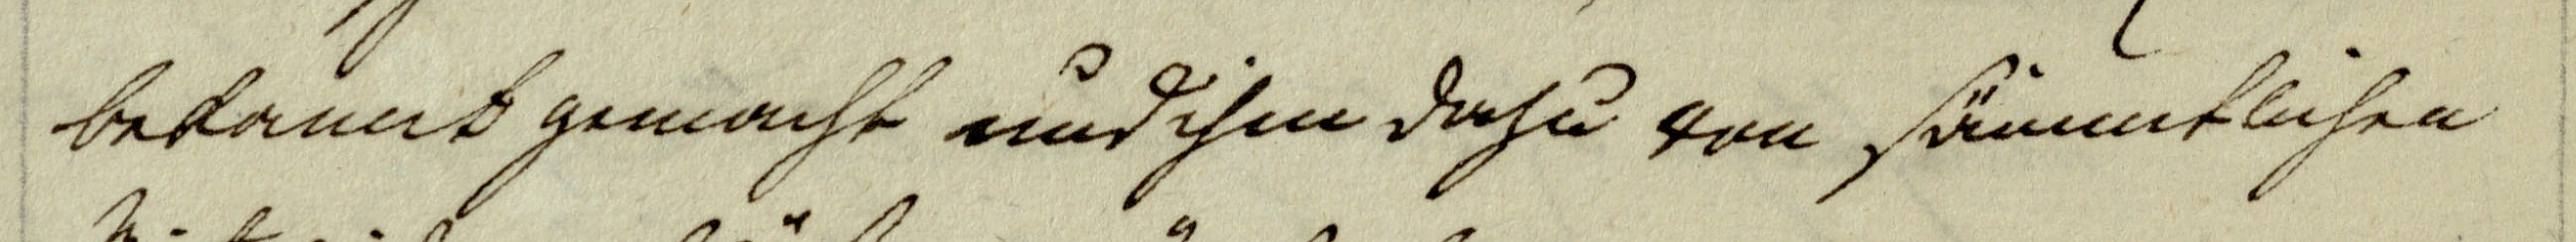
bekannt gemacht und ihm dazu von sämmmtlichen
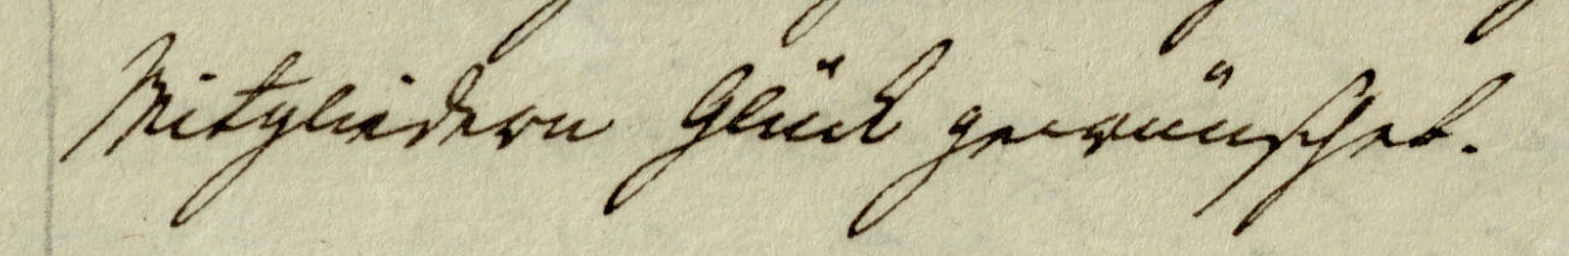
Mitgliedern Glück gewünschet
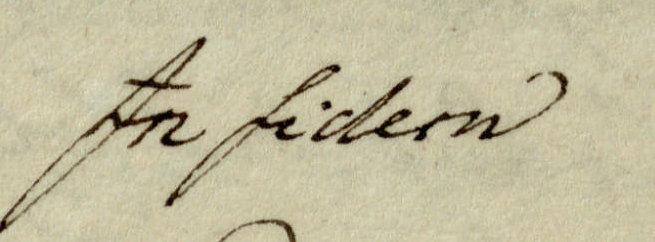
In fidem
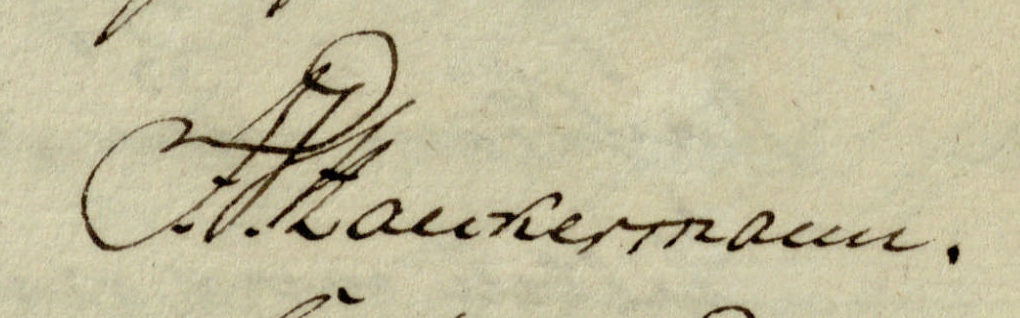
JGHaeckermann.
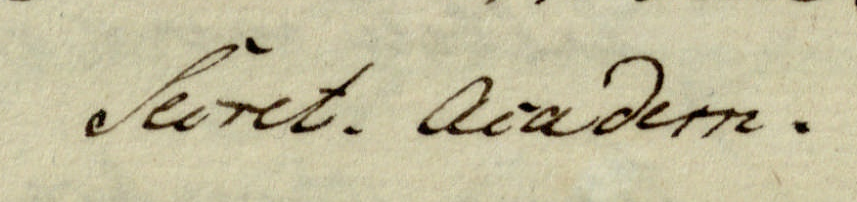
Secret. Academ.
